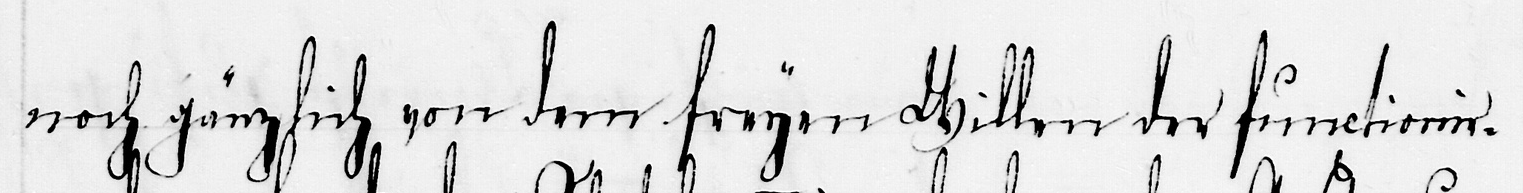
noch gänzlich von dem freyen Willen der functionir¬
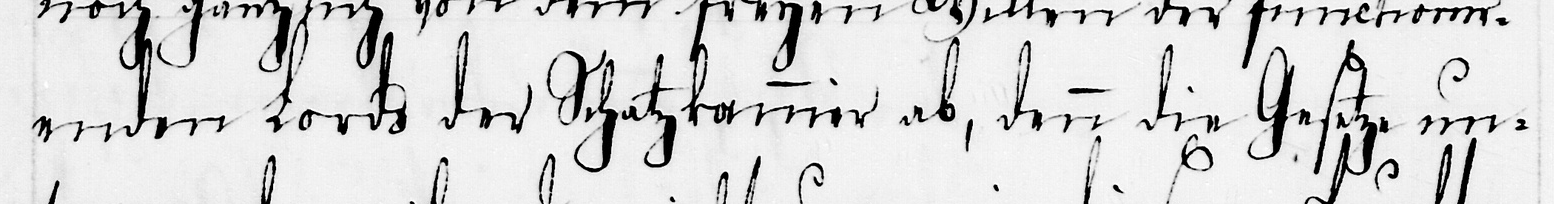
enden Lords der Schatzkammer ab, denn die Gesetze un¬
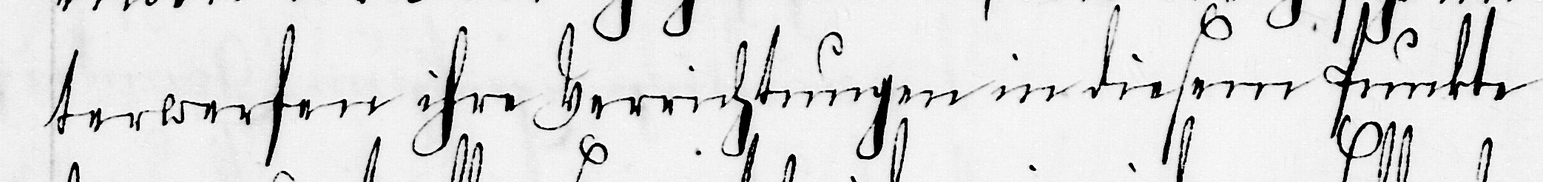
terwerfen ihre Verrichtungen in diesem Punkte
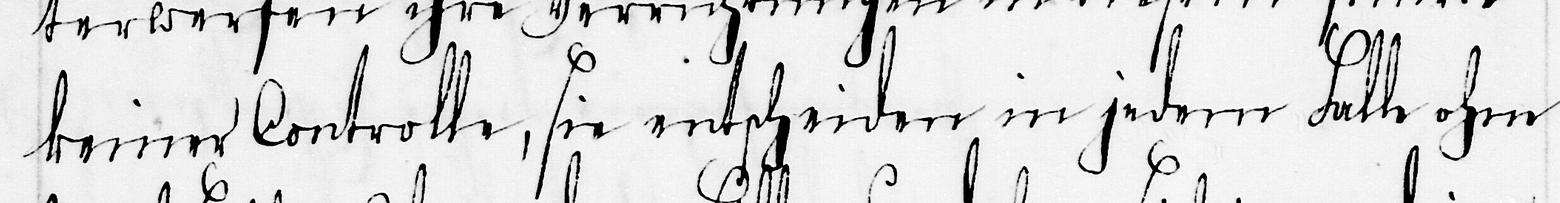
keiner Controlle, sie entscheiden in jedem Falle ohne
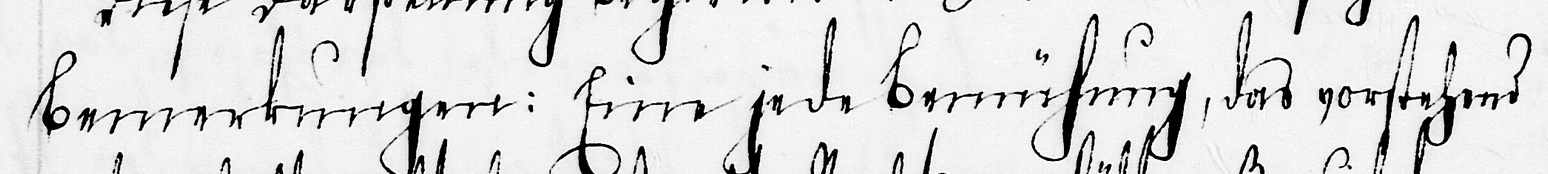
Bemerkungen: Eine jede Bemühung, das vorstehend
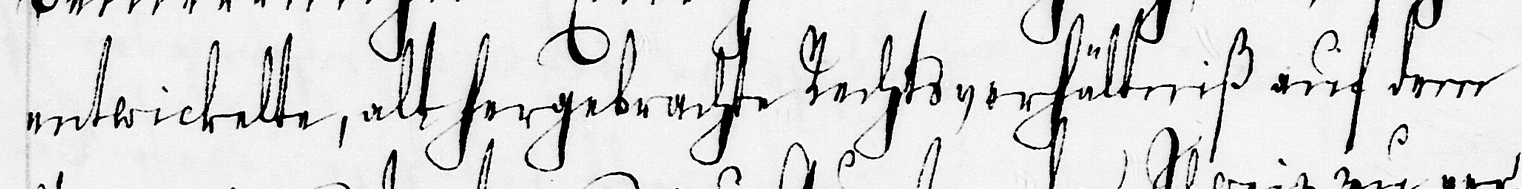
entwickelte, althergebrachte Rechtsverhältniß auf dem
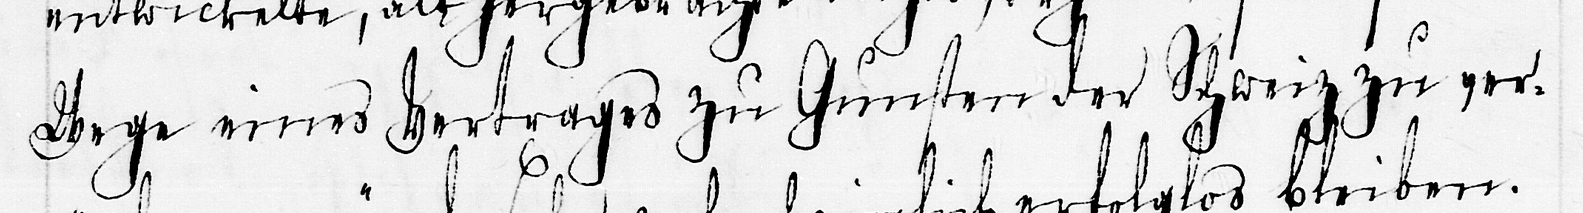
Wege eines Vertrages zu Gunsten der Schweiz zu ver¬
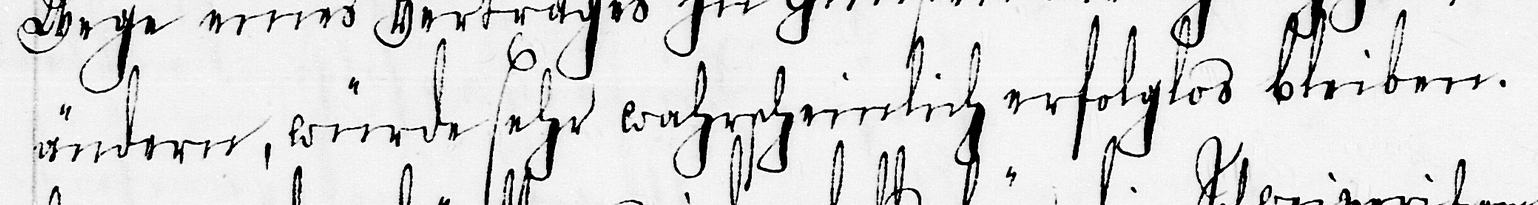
ändern, würde sehr wahrscheinlich erfolglos bleiben.
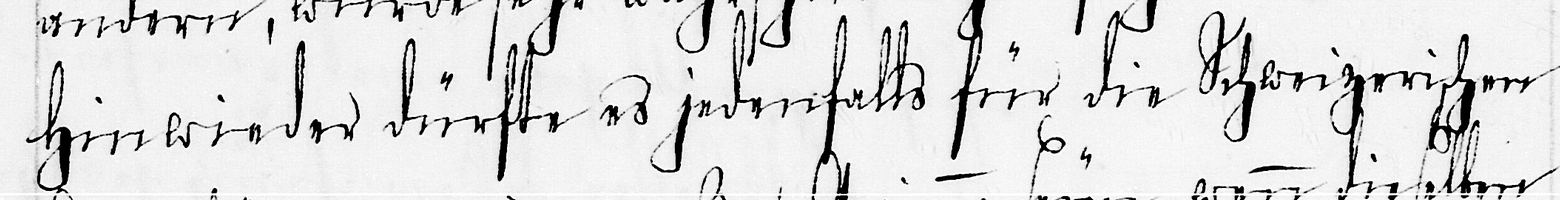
Hinwieder dürfte es jedenfalls für die Schweizerischen
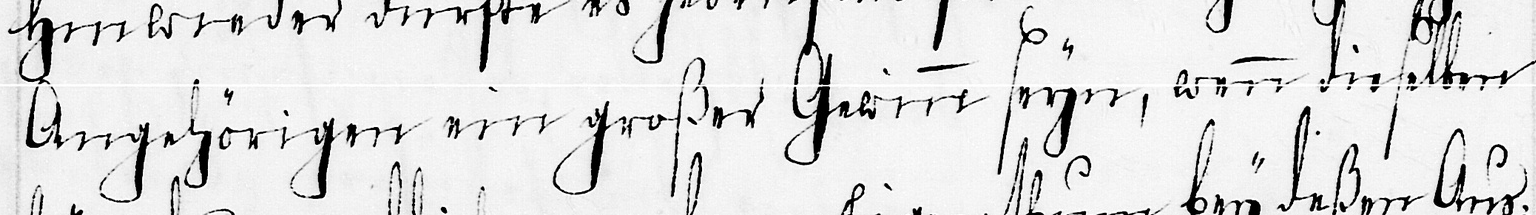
Angehörigen ein großer Gewinn seyn, wenn dieselben
